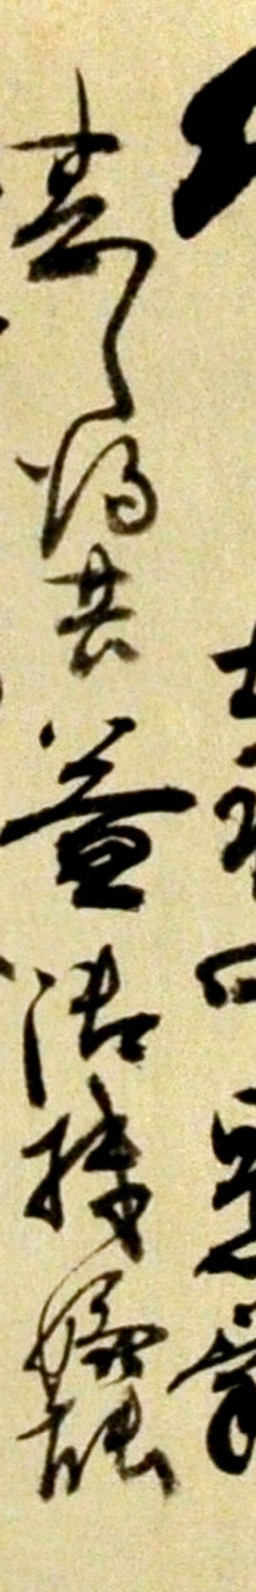甚候得共益御機嫌能
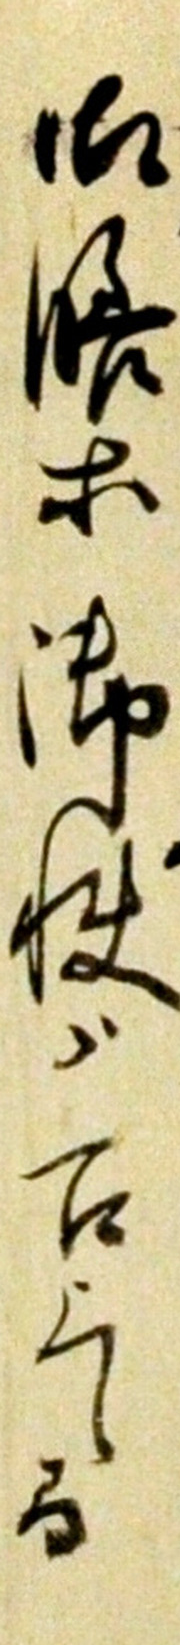御膳等御快被召上候間
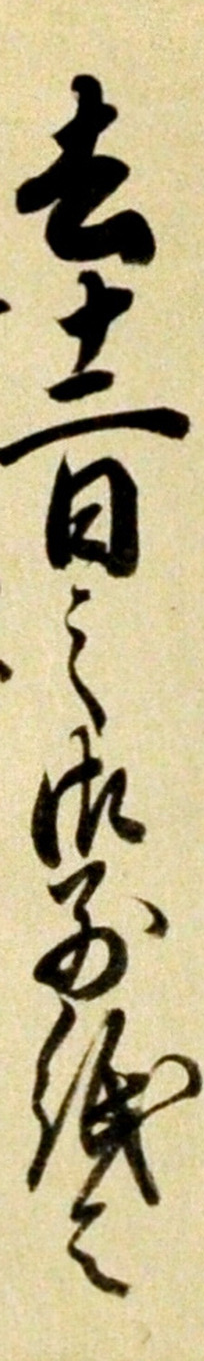去十二日之御別紙令
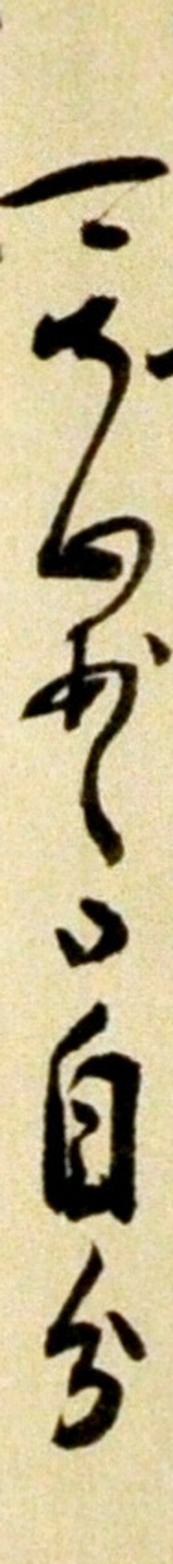可御心安候御自分
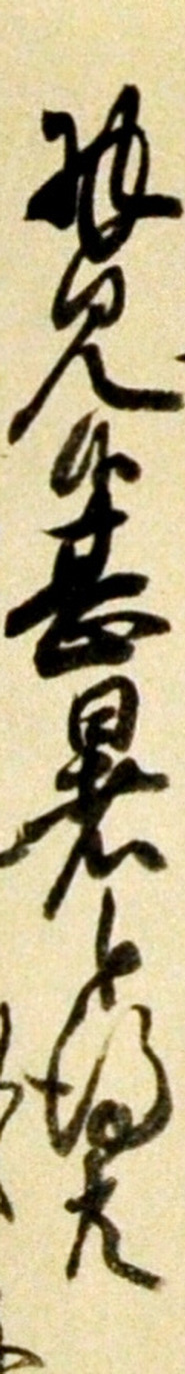拝見候甚暑候得共
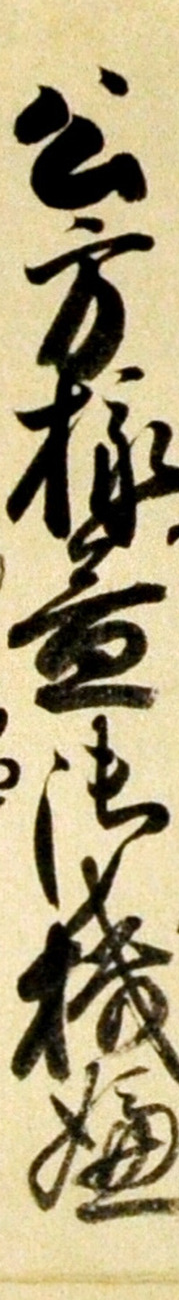公方様益御機嫌
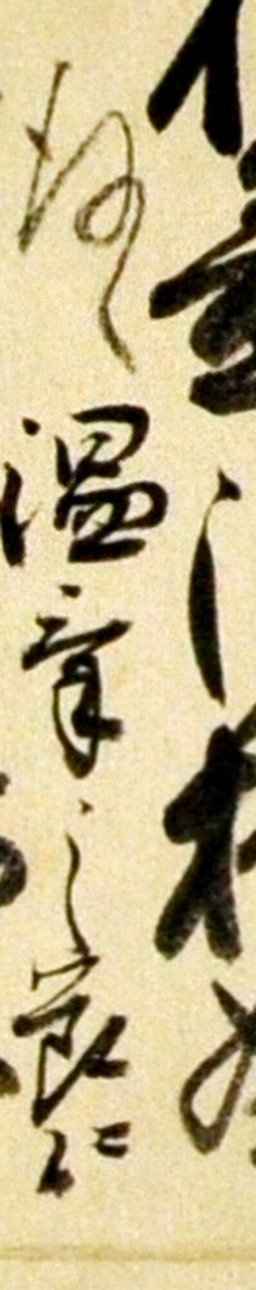存候温気之節ニ候
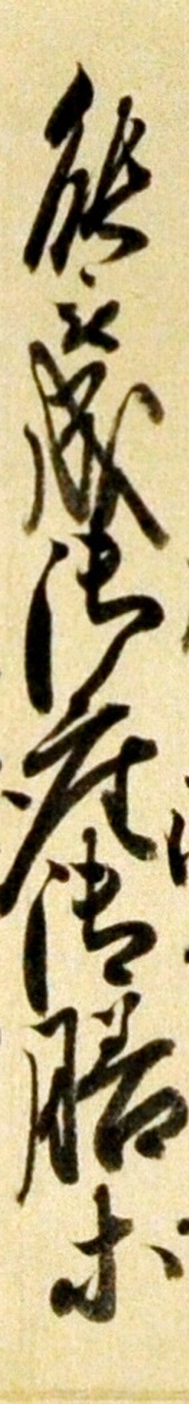能被成御座御膳等
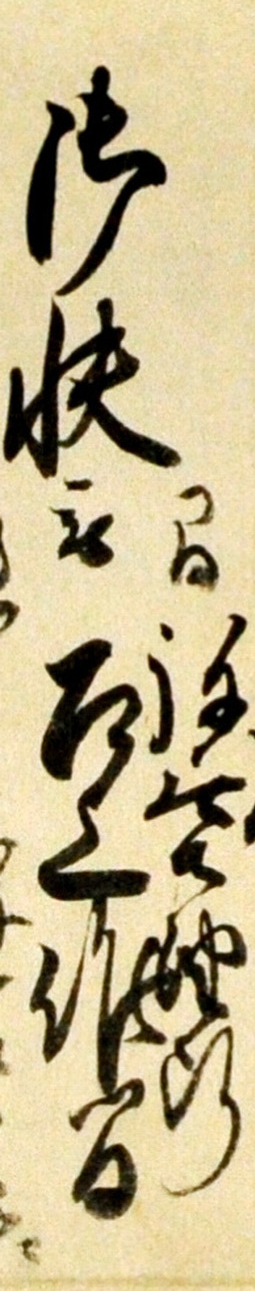御快被召上候間
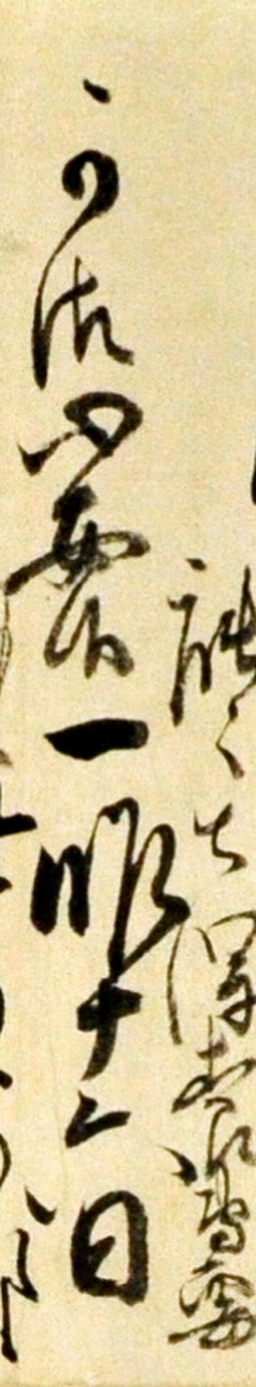可御心安候一昨十六日
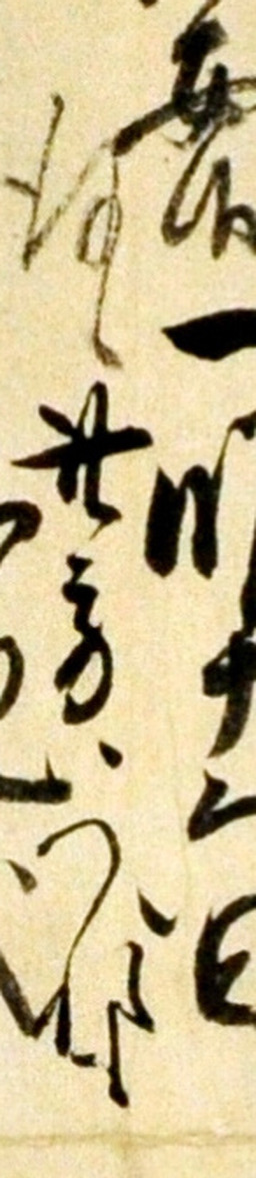存候此方いつれも
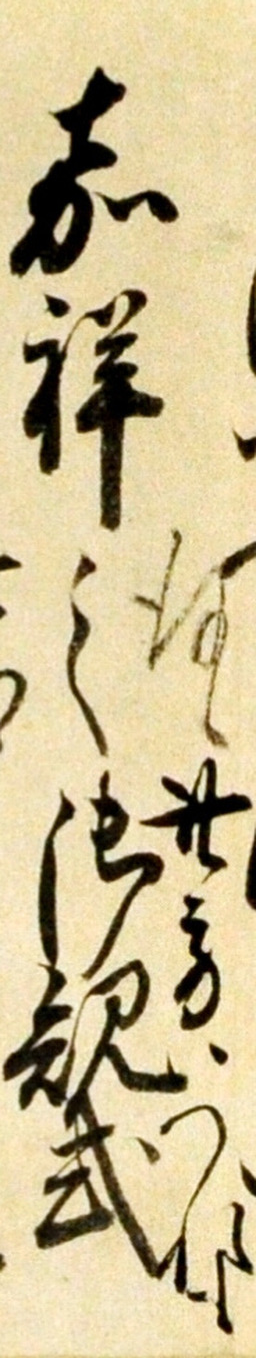嘉祥之御規式
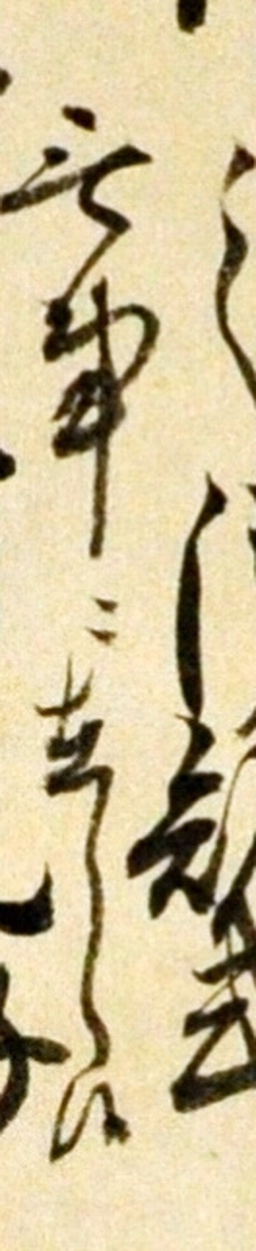無事ニ在之候
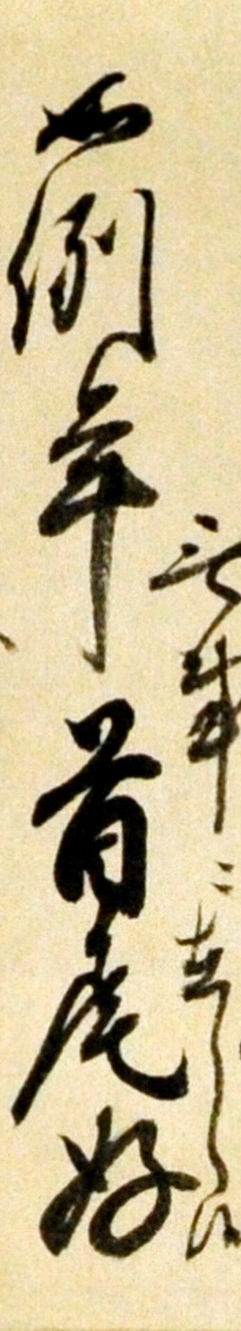如例年首尾好
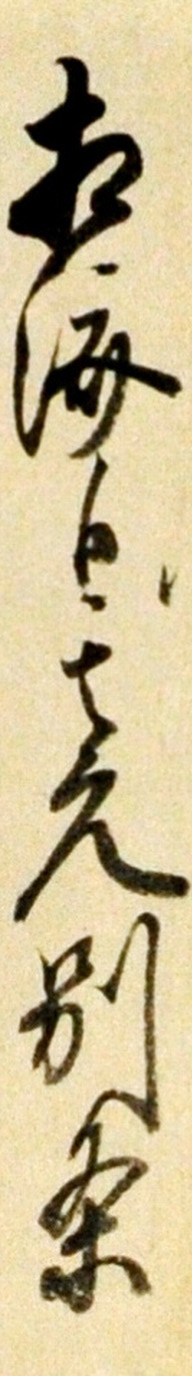相済候其元別条
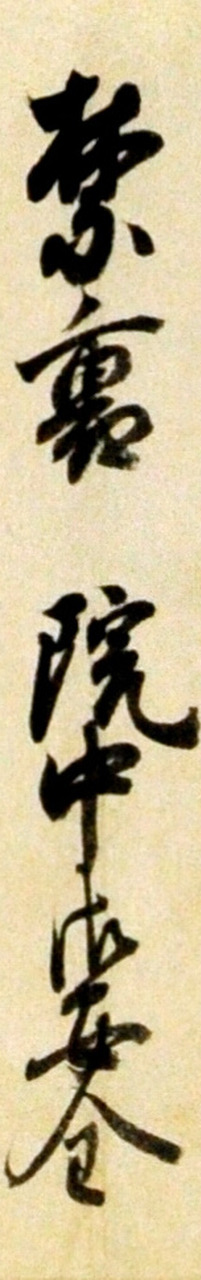禁裏院中御安全
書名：書状
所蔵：伊那市立高遠町図書館・合同会社AMANE
